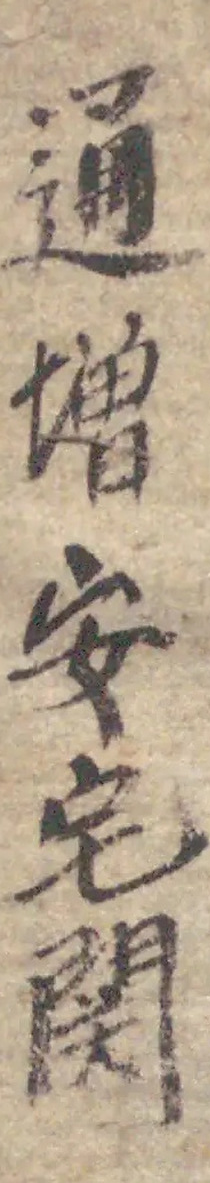通増安宅関

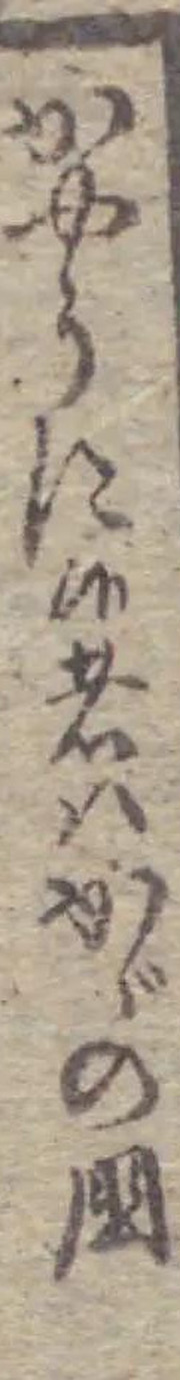かやうに御者はかゞの国
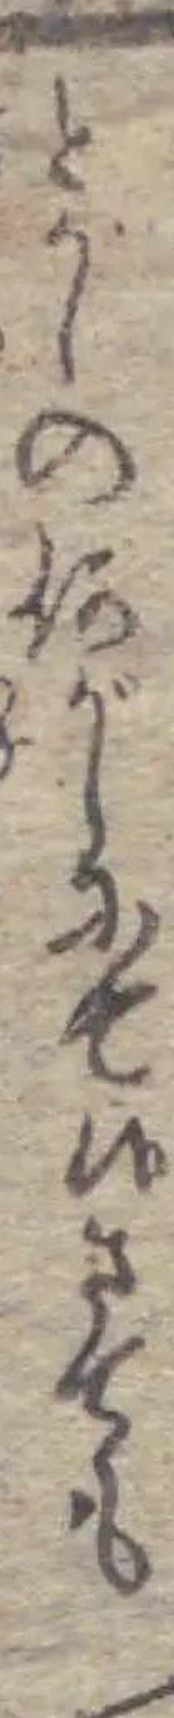とがしの何がしにて候さても
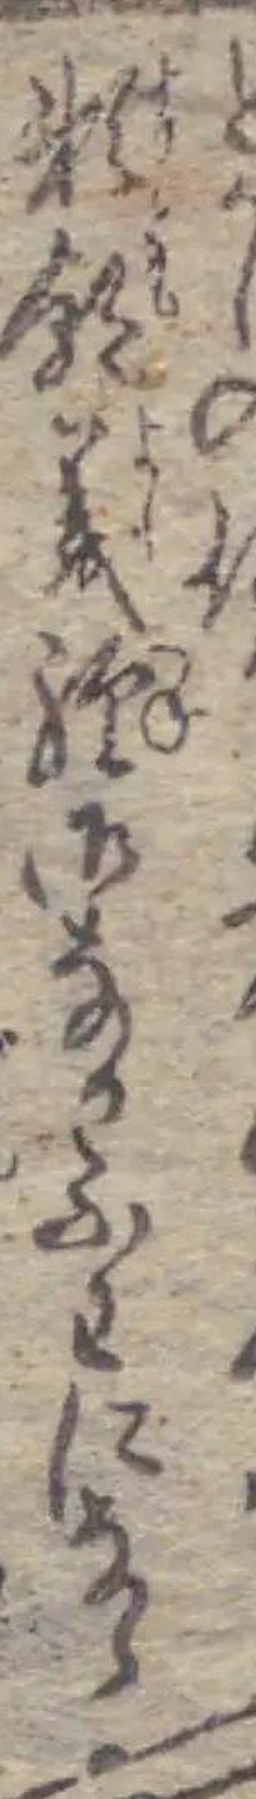頼朝義経御なかふわに
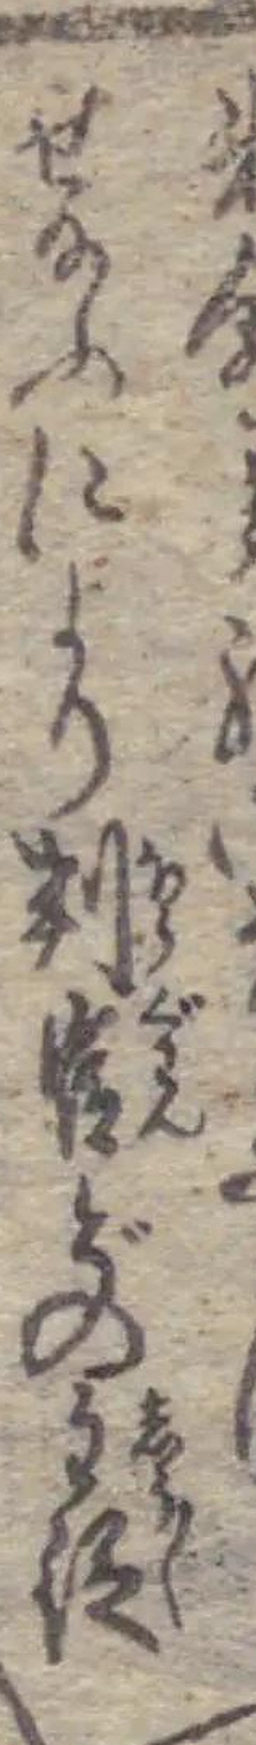ならせ給ふにより判官どの主従
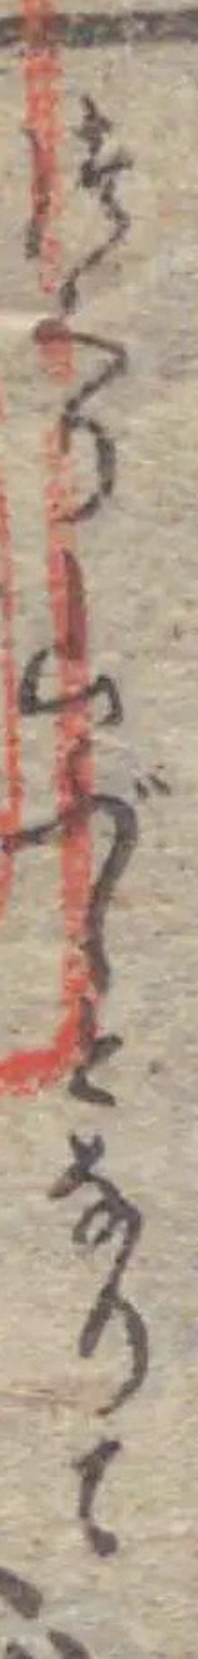つくり山ぶしとなりて
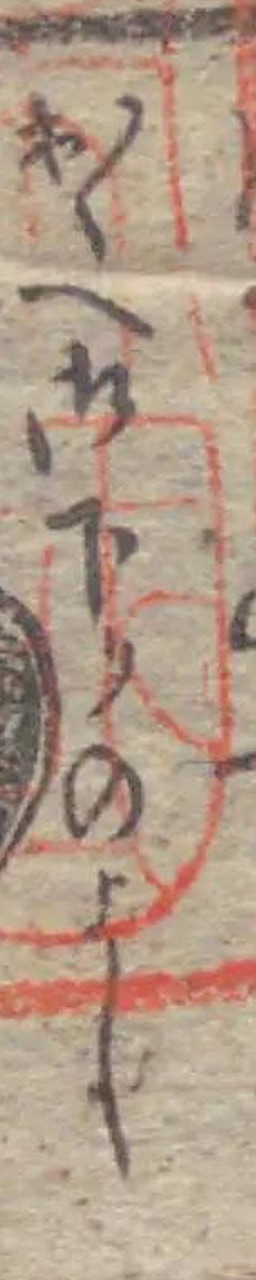おくへ御下りのよし
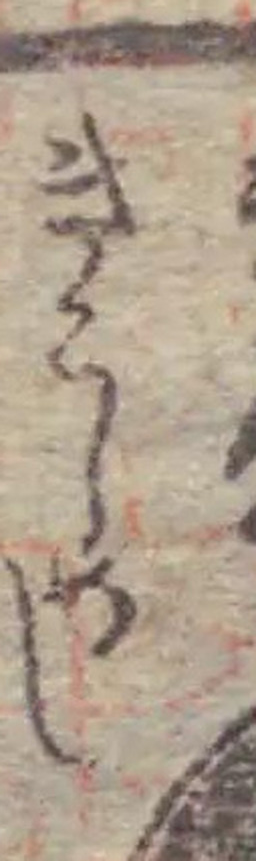きこしめし
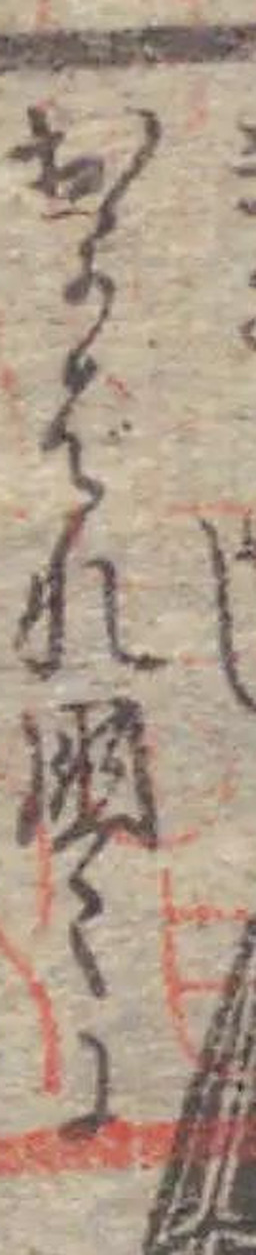およばれ国〻に
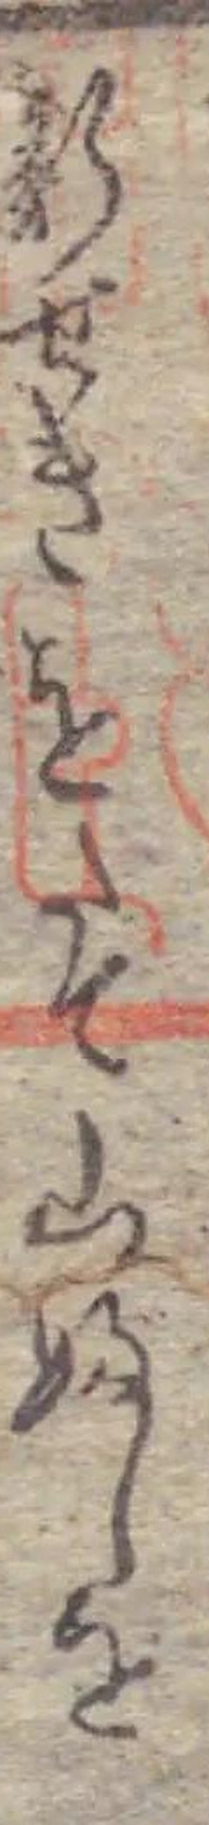新せきをたて山ふしを
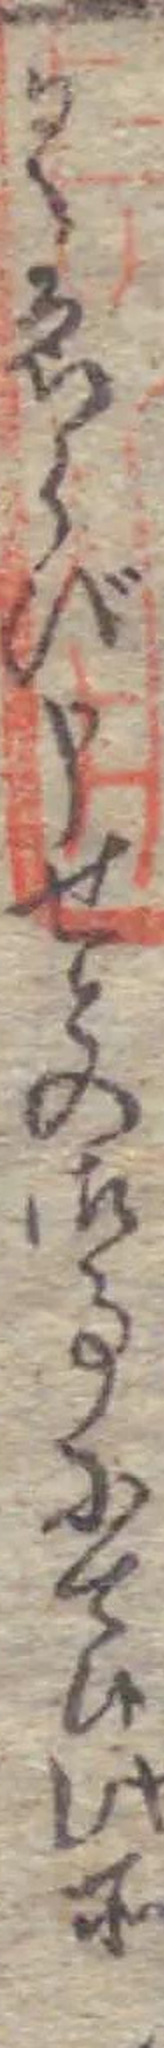かくゑらび申せとの御事にて候此所
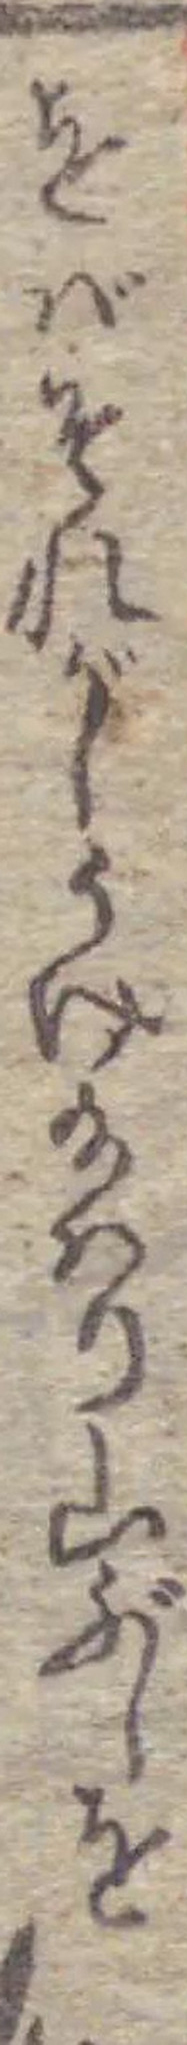をばそれがしうけ給はり山ぶしを
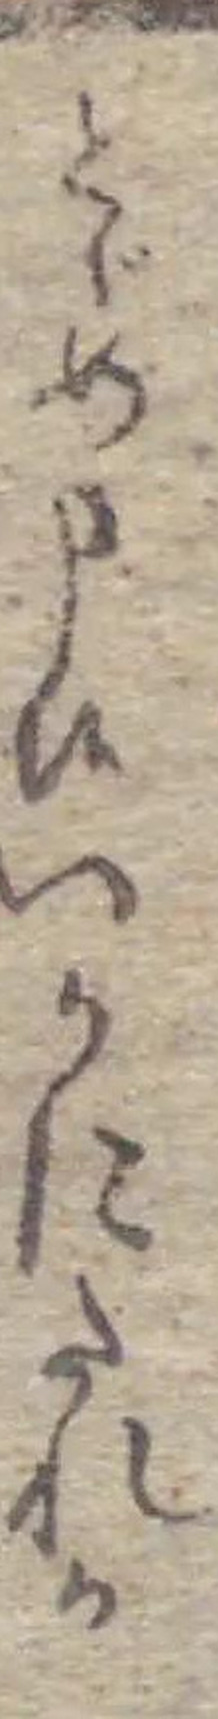とゞめ申候いかにたれか
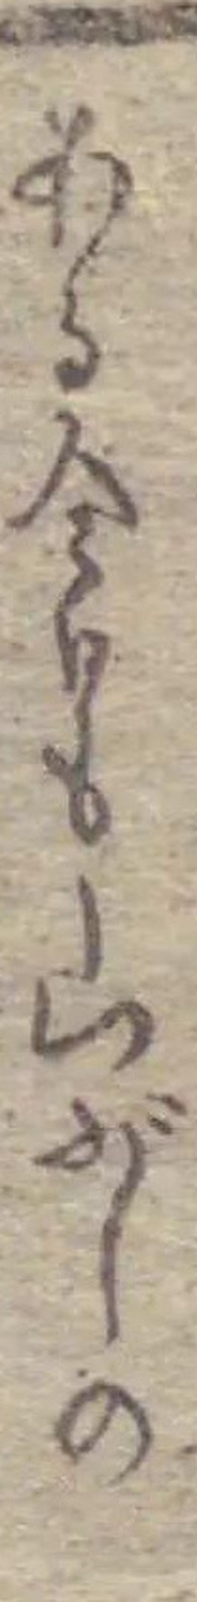ある今日も山ぶしの

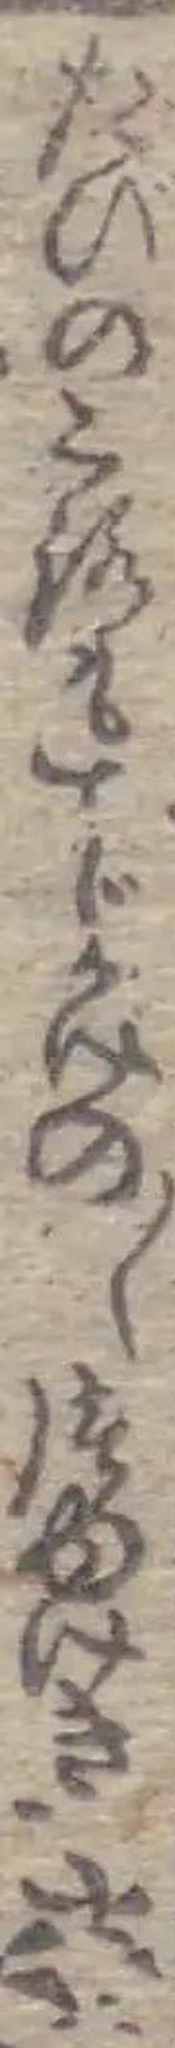たびのころもすゞかけの〳〵つゆけき
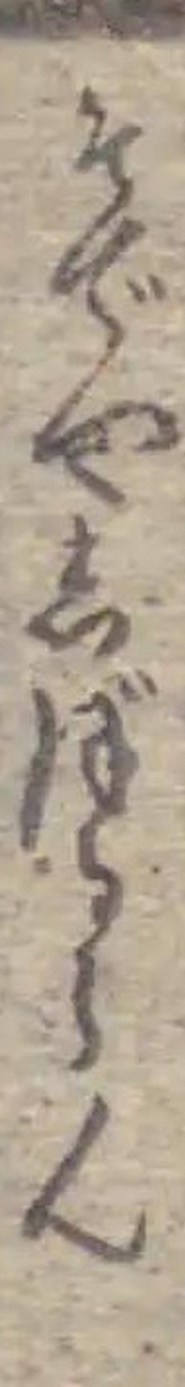そでやしぼるらん
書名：通増安宅関 2巻
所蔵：国立国会図書館 National Diet Library, JAPAN
